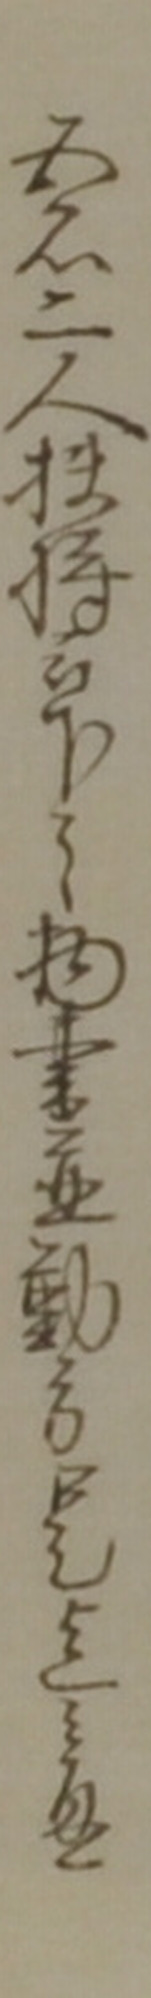五石二人扶持被下之物書並勤方是迄之通

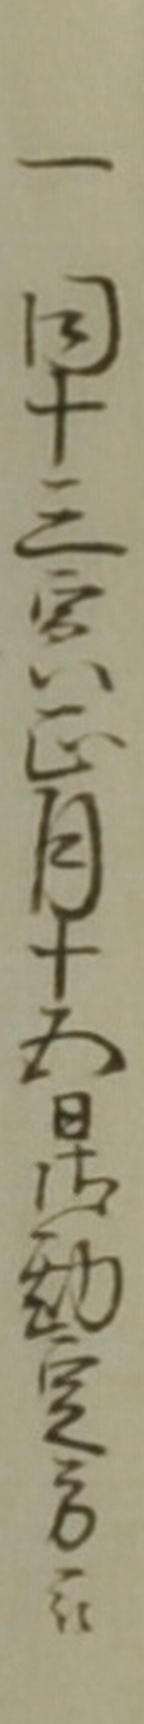一同十三寅正月十五日御勘定方被
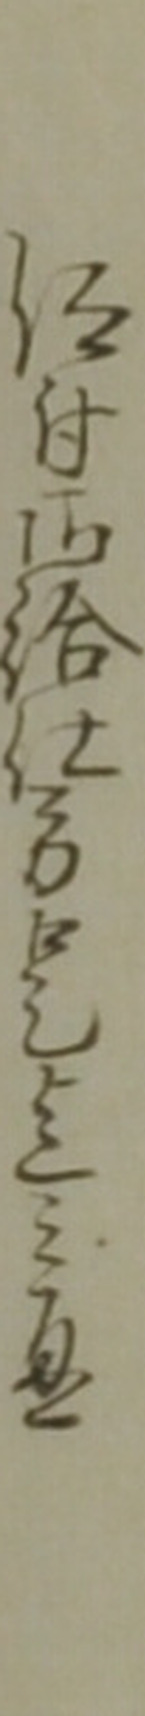仰付御給仕方是迄之通
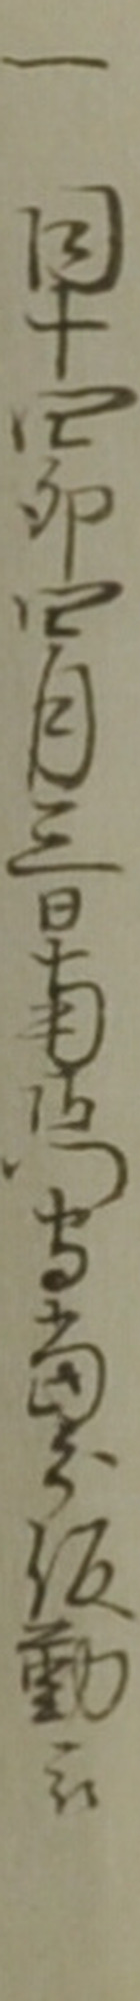一同十四卯四月三日南御門守当分仮勤被
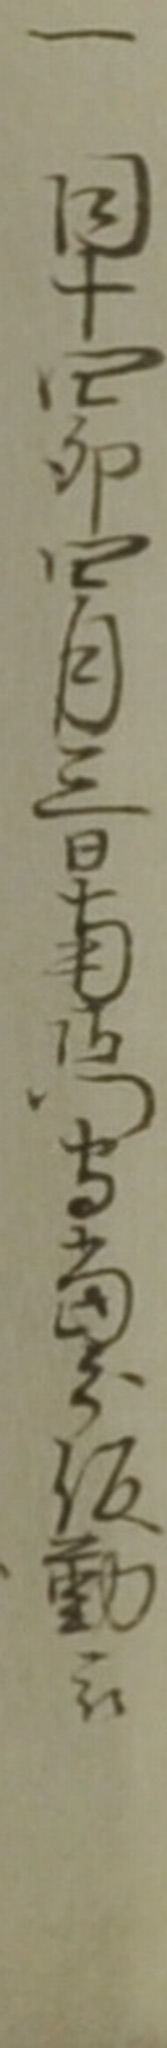一同十四卯四月三日南御門守当分仮勤被
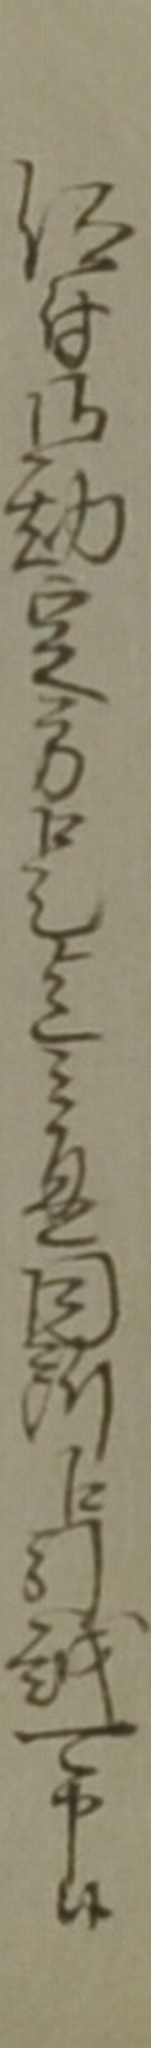仰付御勘定方是迄之通同所江引越可申候
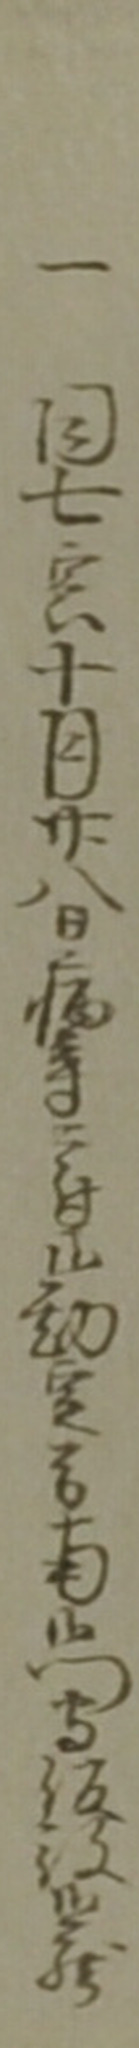一同七寅十月廿八日病気ニ付勘定方南御門守仮役御蔵
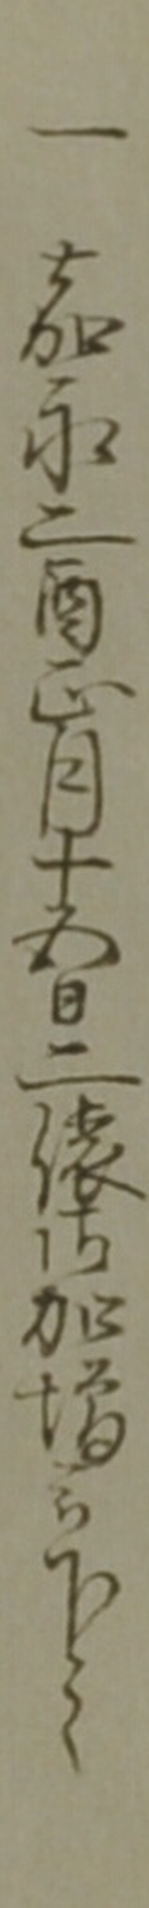一嘉永二酉正月十五日二俵御加増被下之
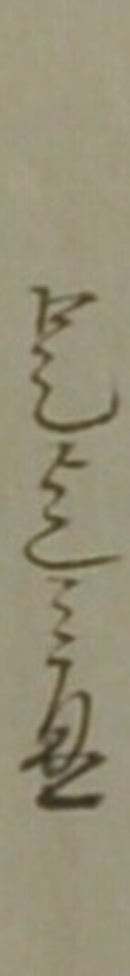是迄之通
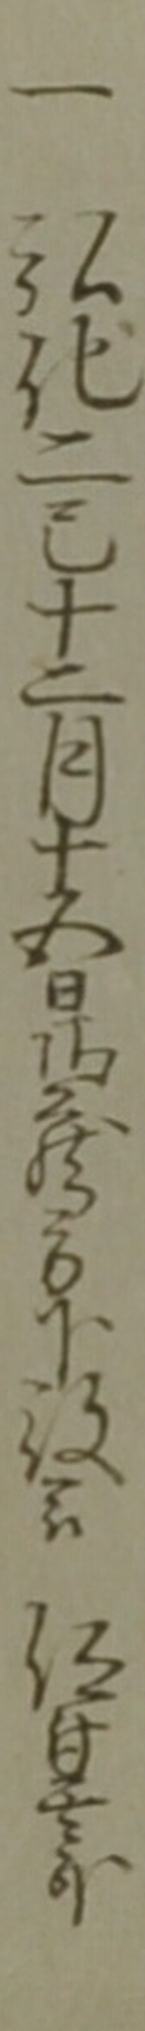一弘化二巳十二月十五日御蔵方下役被仰付其外

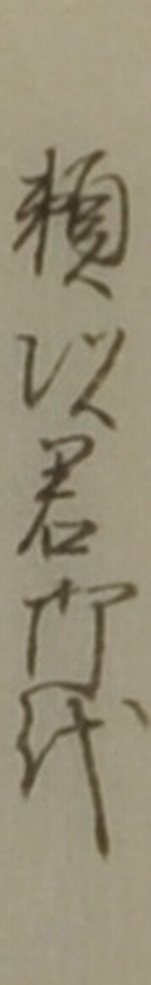頼以君御代
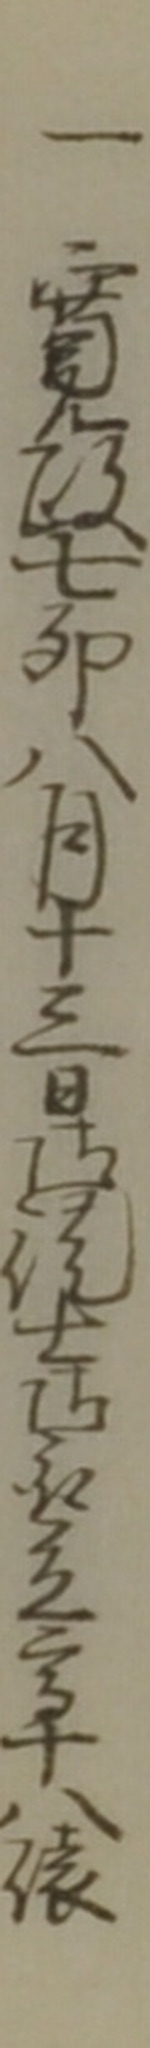一寛政七卯八月十三日御徒士御取立高十八俵
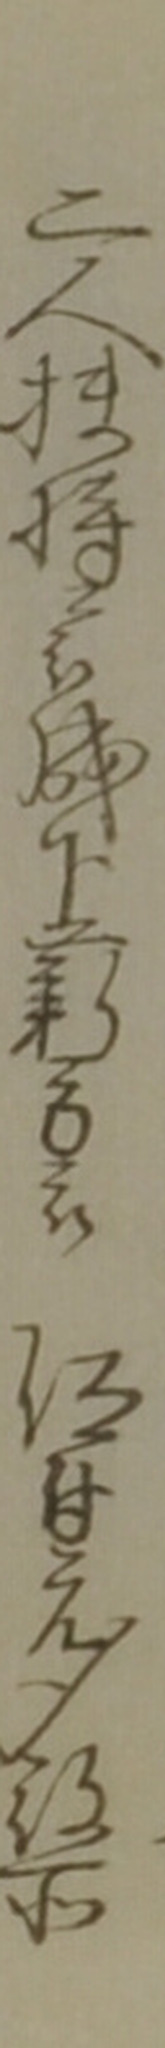二人扶持ニ被成下薪方被仰付元〆役所
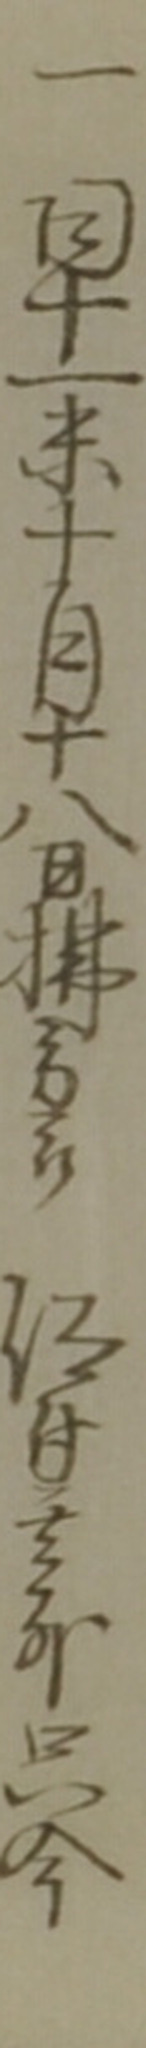一同十一未十月十八日払方被仰付其外只今
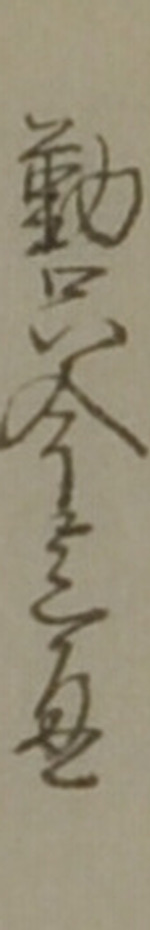勤只今迄通
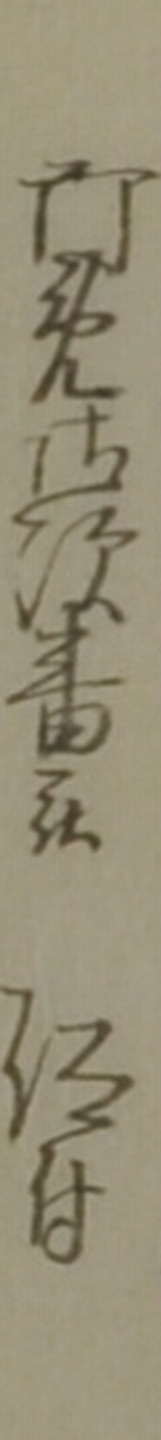御免御次番被仰付
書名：無足諸士勤仕録（七）
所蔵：伊那市立高遠町図書館・合同会社AMANE
